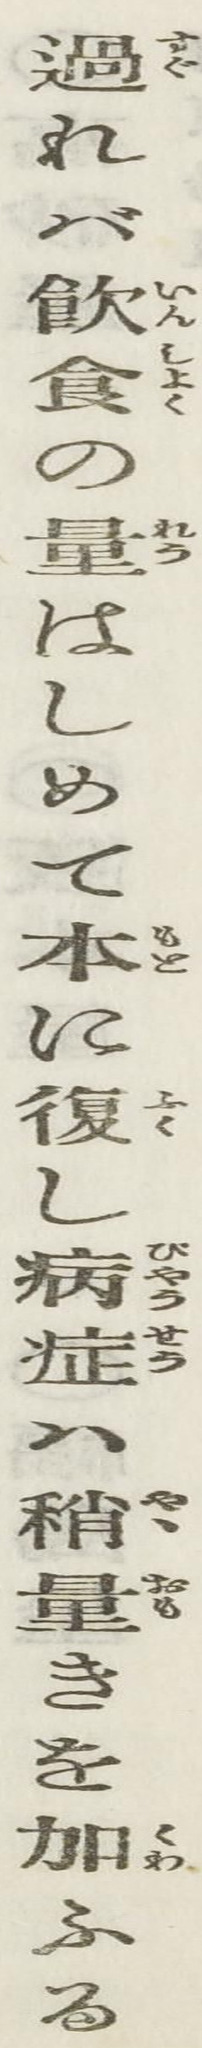過れば飲食の量はしめて本に復し病症は稍量きを加ふる
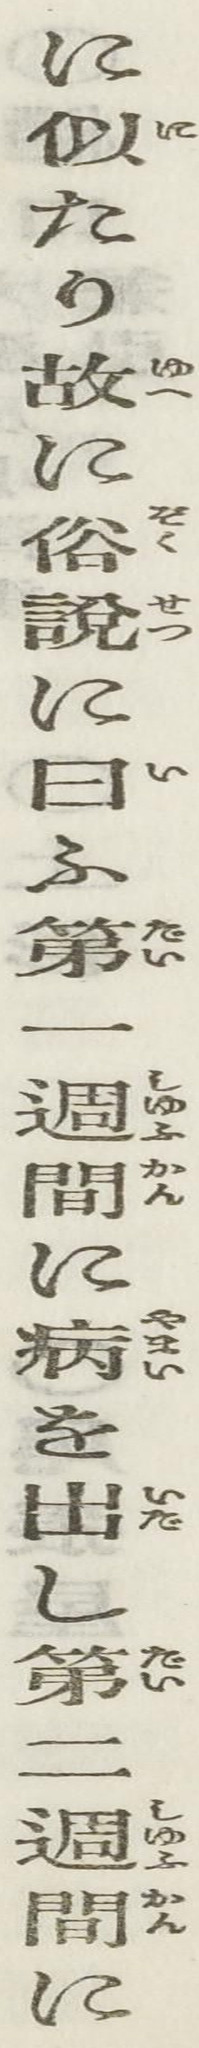に似たり故に俗説に曰ふ第一週間に病を出し第二週間に
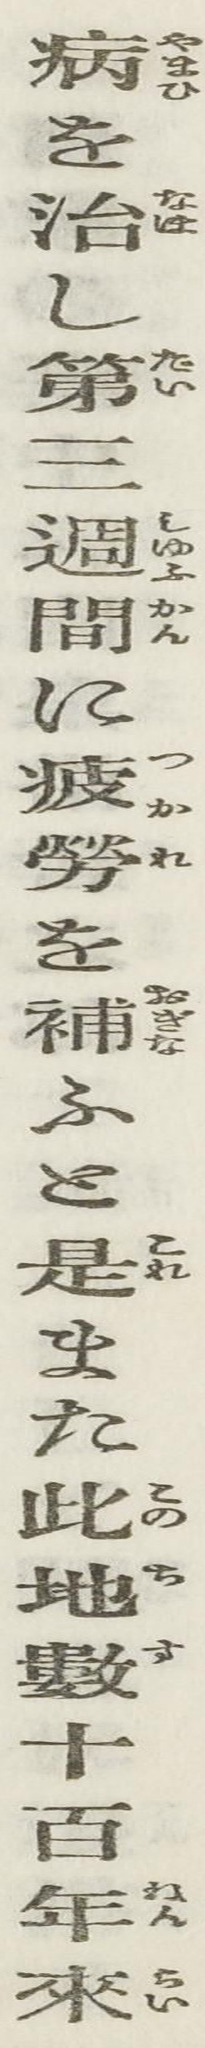病を治し第三週間に疲労を補ふと是また此地数十百年来
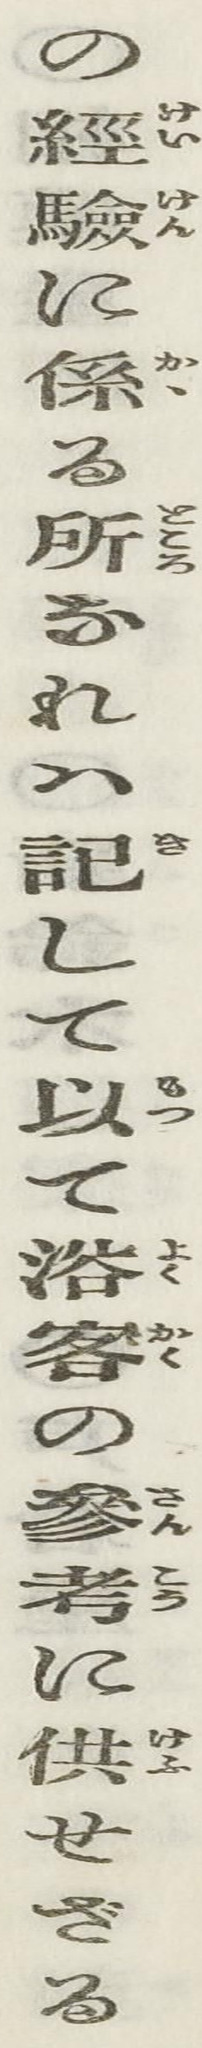の経験に係る所なれは記して以て浴客の参考に供せざる
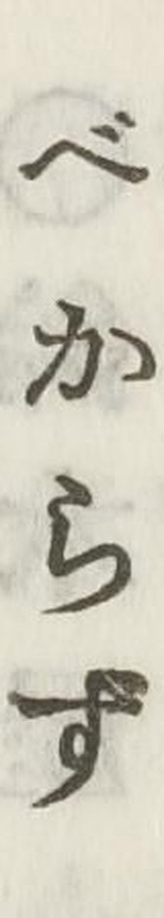べからず
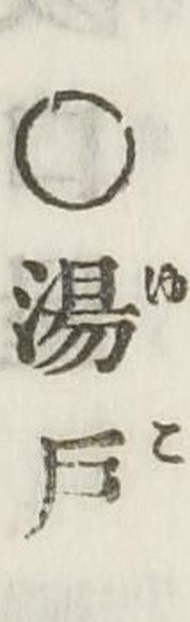○湯戸
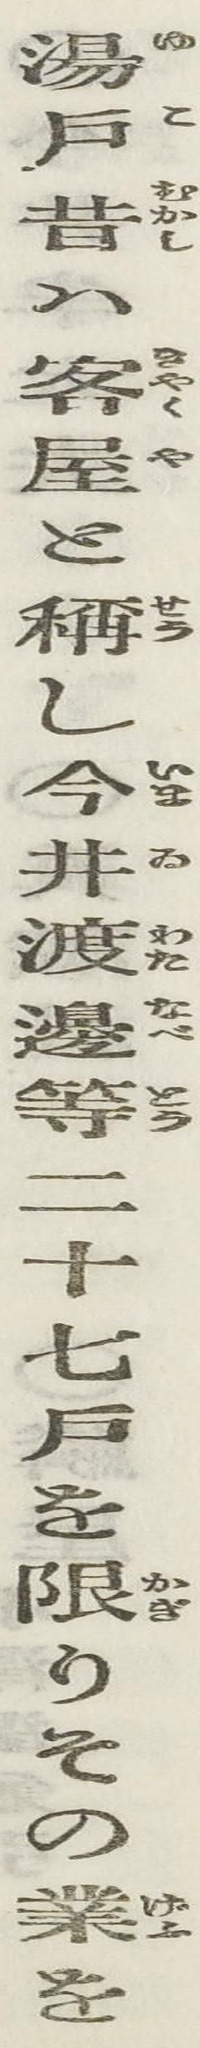湯戸昔は客屋と称し今井渡邊等二十七戸を限りその業を
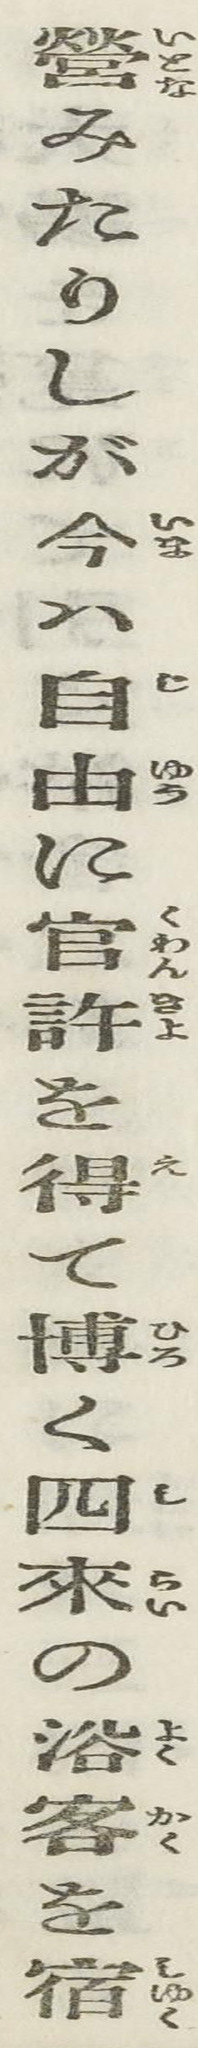営みたりしが今は自由に官許を得て博く四来の浴客を宿
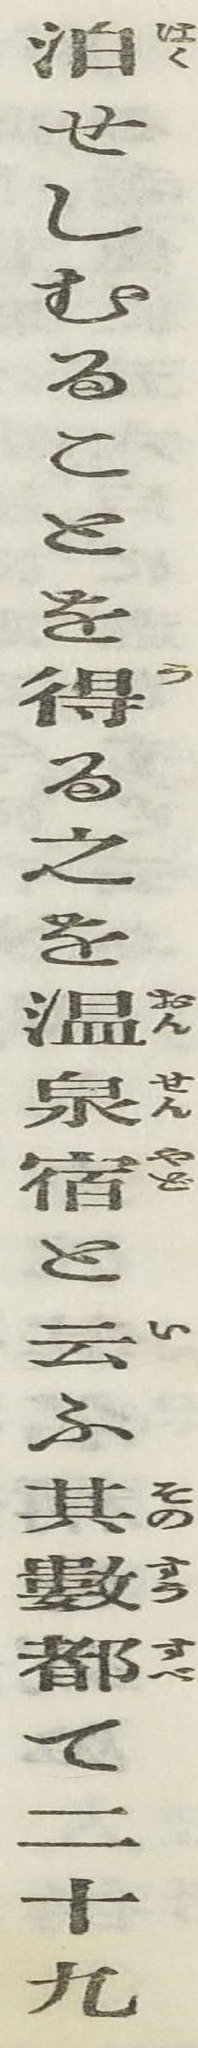泊せしむることを得る之を温泉宿と云ふ其数都て二十九

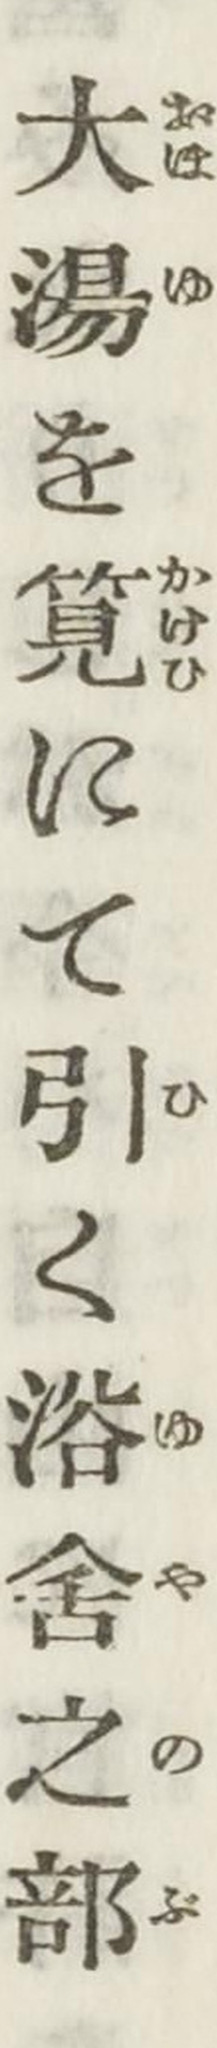大湯を筧にて引く浴舎之部
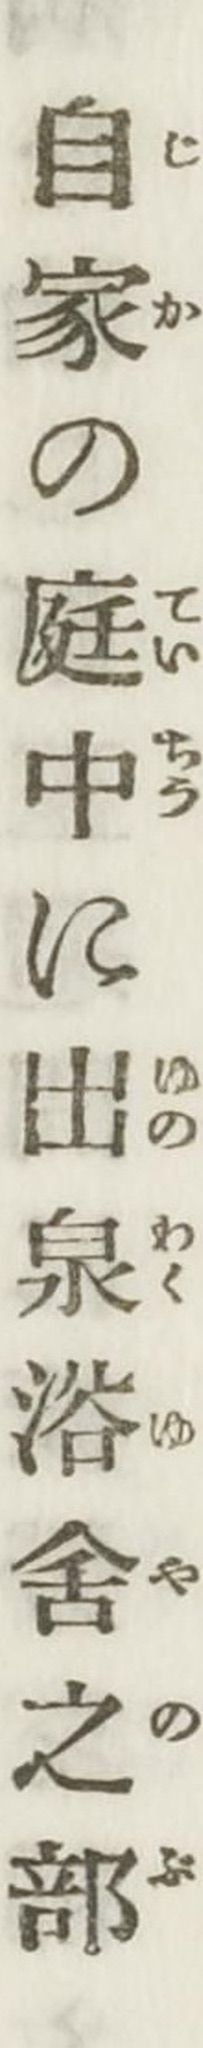自家の庭中に出泉浴舎之部
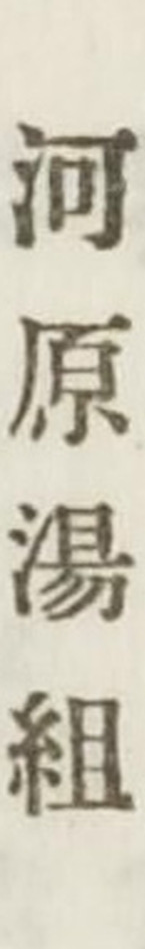河原湯組
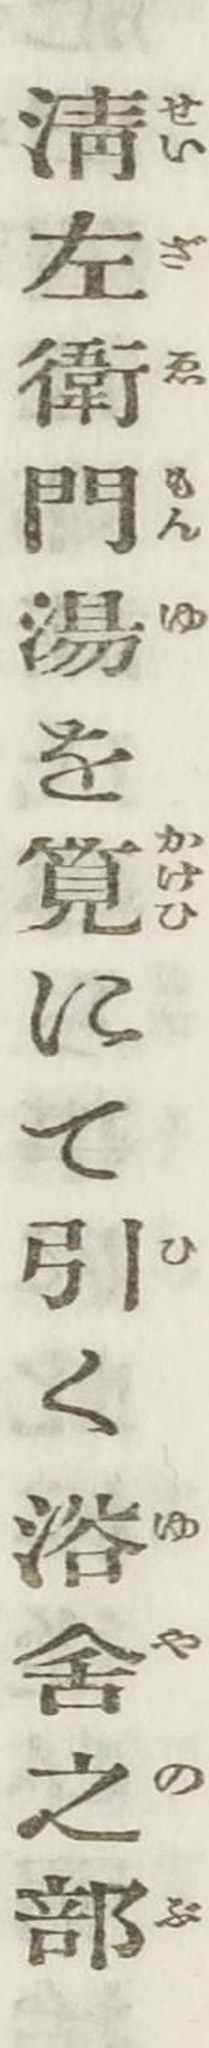清左衛門湯を筧にて引く浴舎之部
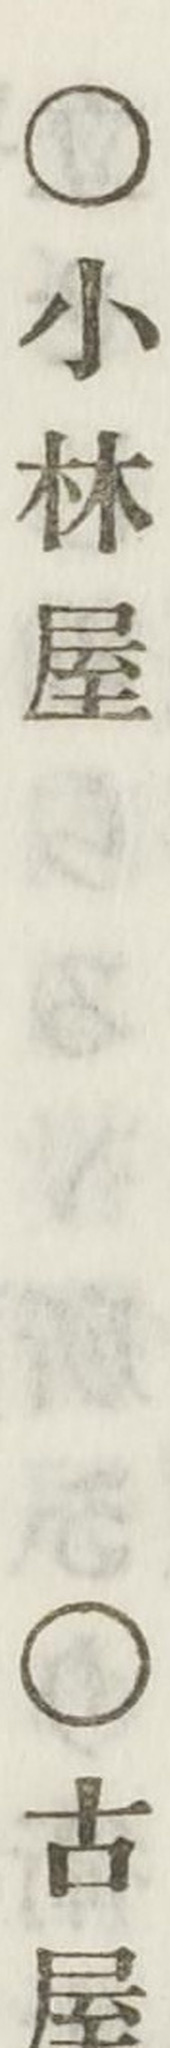○小林屋○古屋
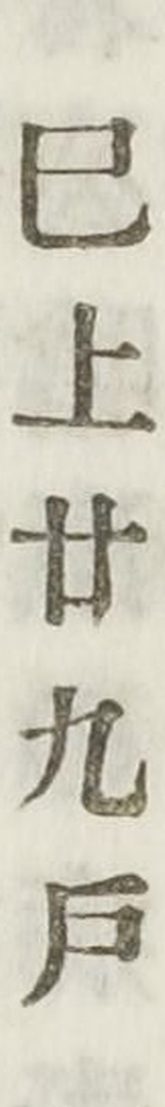巳上廿九戸
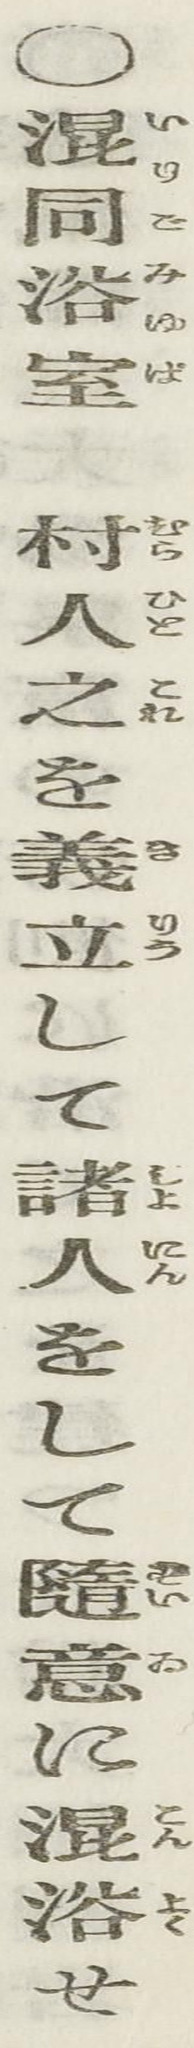○混同浴室村人之を義立して諸人をして随意に混浴せ
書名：熱海獨案内　全
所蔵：東京大学地震研究所図書室 Earthquake Research Institute Library, The University of Tokyo, JAPAN
